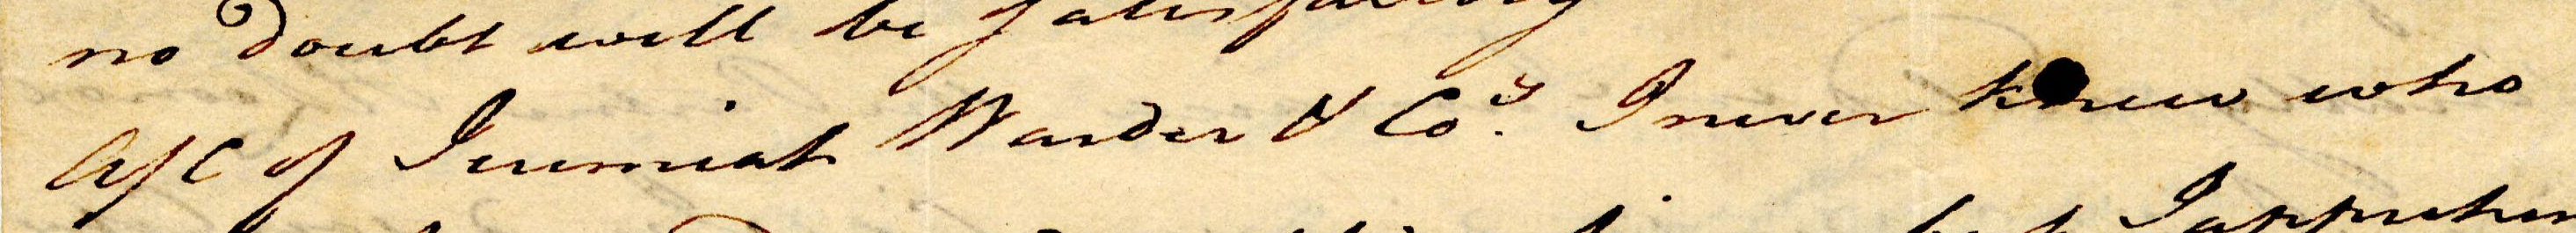A/C of Jeremiah Warder & Co^y. I never knew who
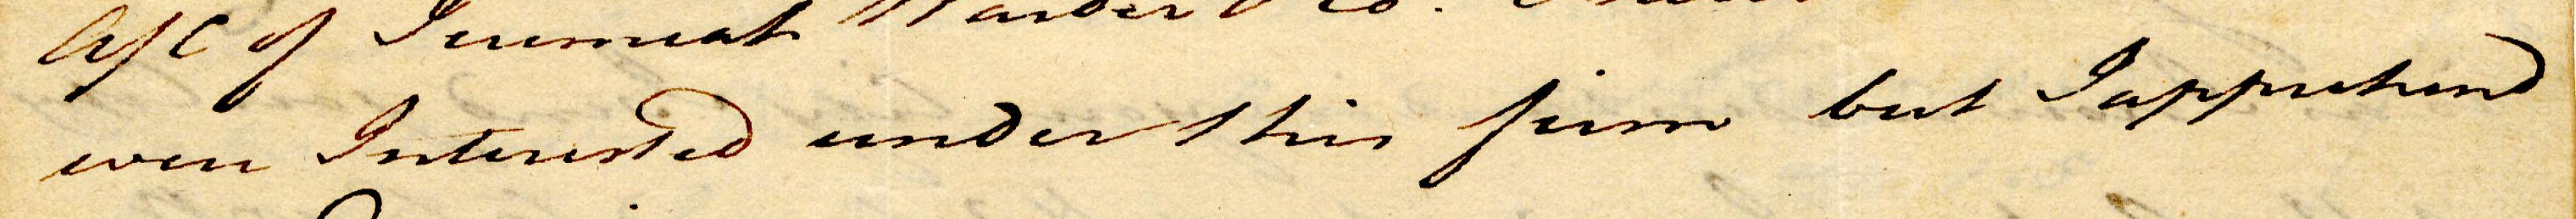even Interested under this firm but I apprehend
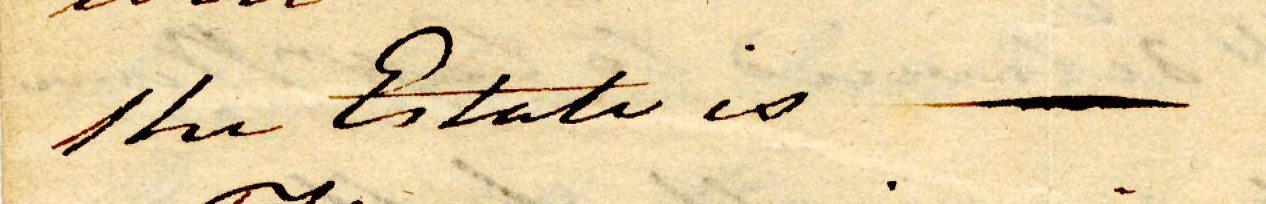the Estate is-
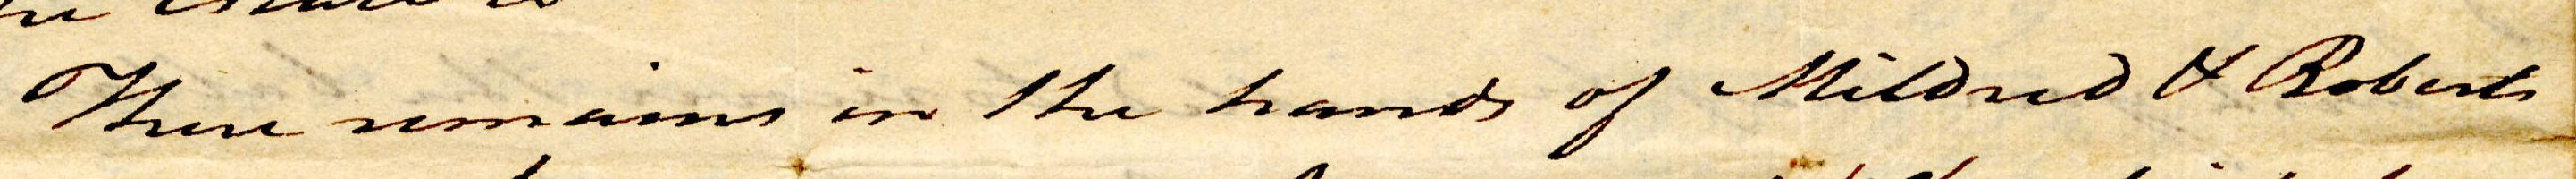There remains in the hands of Mildred & Roberts
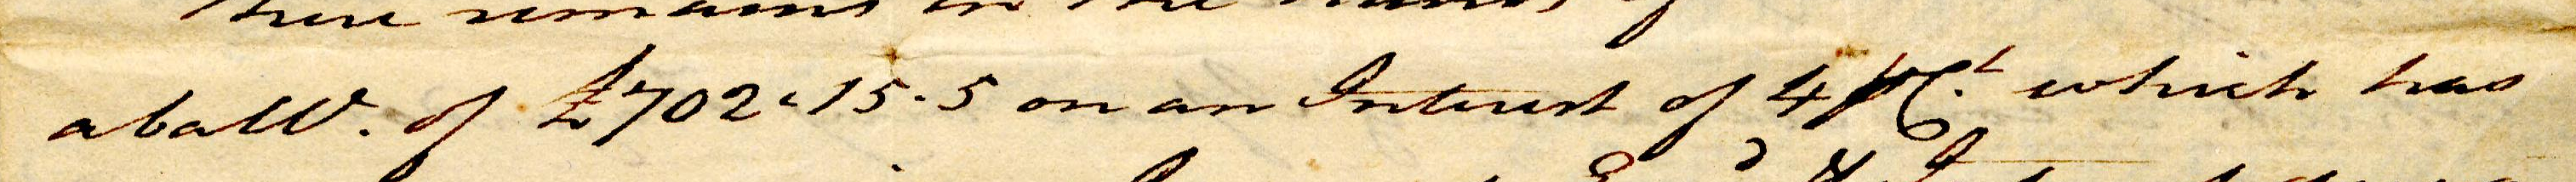a ball^e. of £702.15. 5 on an Interest of 4 per C^t. which has
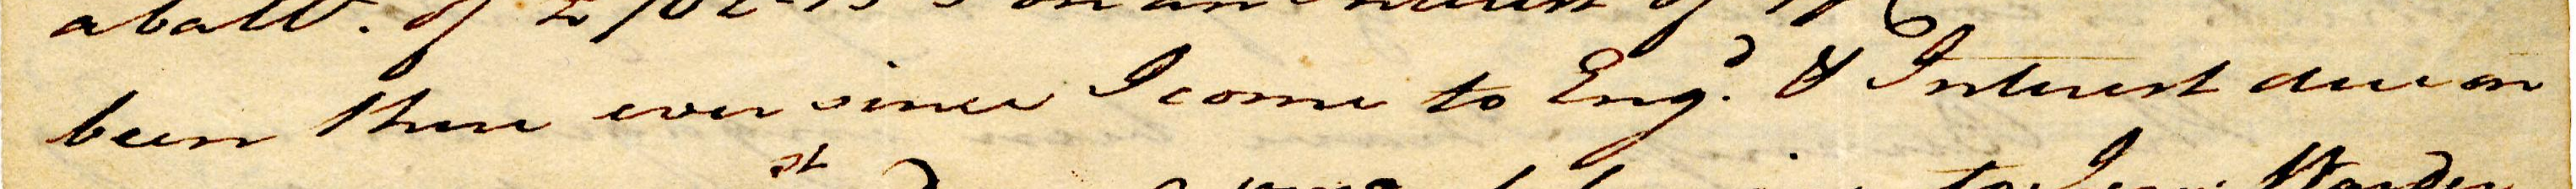been then ever since I come to Eng^d. & Interest due on
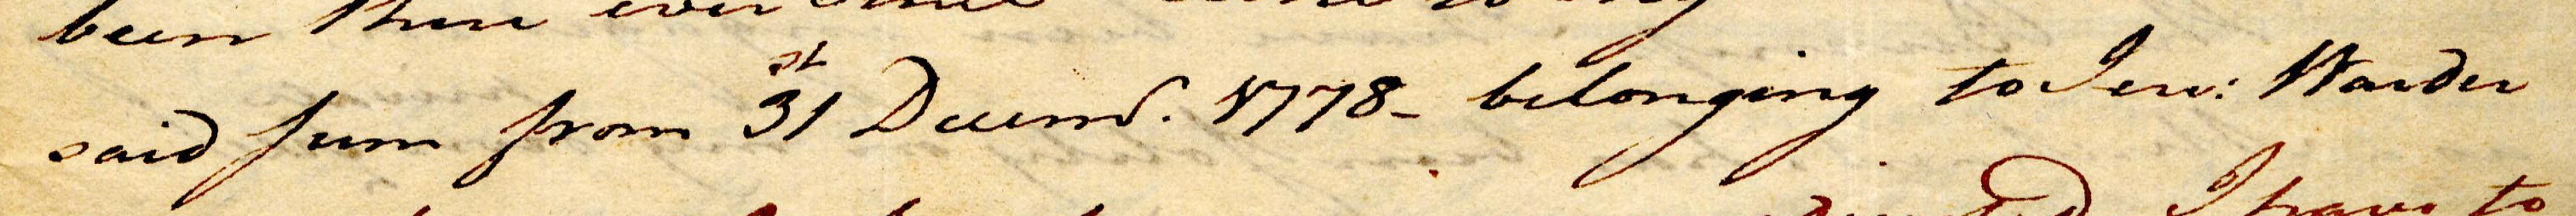said sum from 31^st Decem^r. 1778- belonging to Jere: Warder
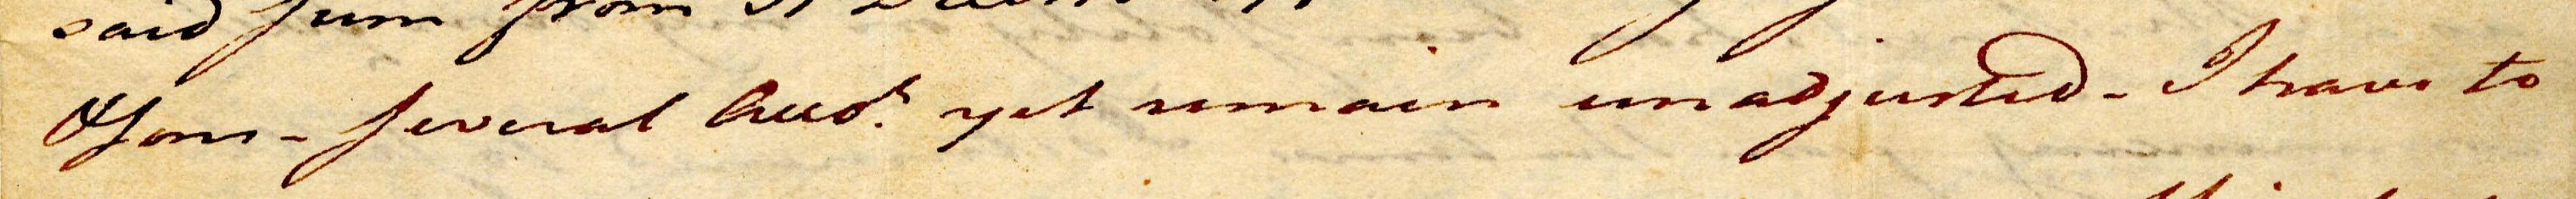& Sons. Several Acco^t. yet remain unadjusted. I have to
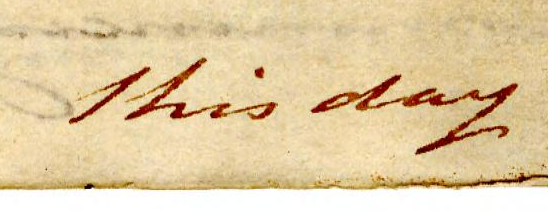this day
